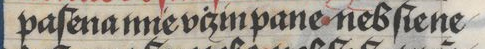paſena mie ucżin pane.neb ie ne¬
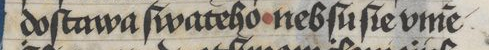doſtawa ſwateho.neb ſu ſie vmē¬
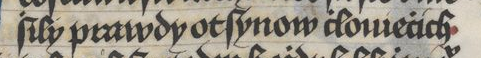ẛily prawdy otſynow ċlovieċích.
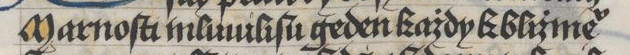Marnoſti mluviliſu geden każdy k bliżniev
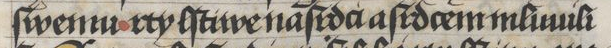ſwemu.rty lſtiwe naſrdci a ſrdcem mluvili
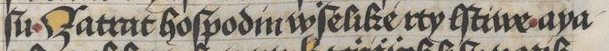ſu.Zatrat podin wẛeliké rty lſtiwe.a ya¬
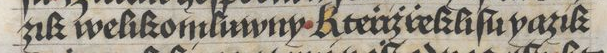zik welikomluwny.Kteṙiż řekli ſu yazik
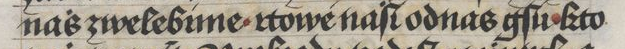naṡ zwelebíme.rtowé naẛi odnas gſu.kto
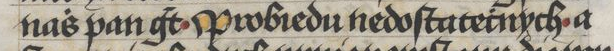naṡ pan ḡt.Probiedu nedoſtateċnych.a
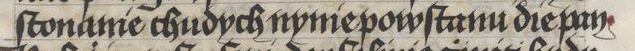ſtonanie chudych nynie powſtanu díe pan.
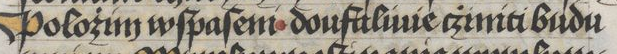Polożím wſpaſenií.doufaliuie cżiniti budu
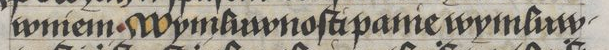w mem.Wymluwnoſti panie wymluw¬
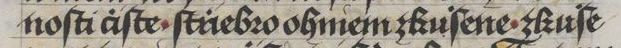noſti ċiſte.ſtṙiebro ohniem zkuẛene.zkuẛe¬
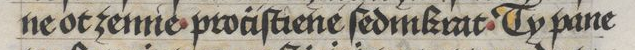ne ot zemie.proċiſtené ſedmkrat.Ty pane
